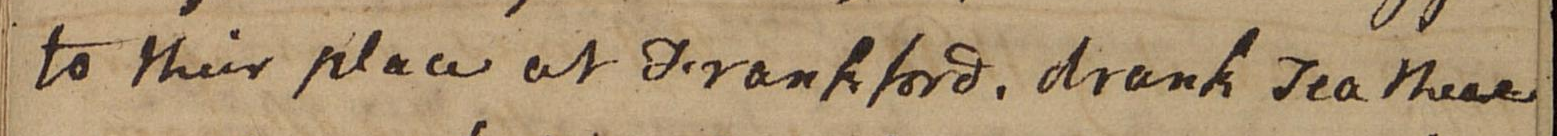to their place at Frankford, drank Tea there
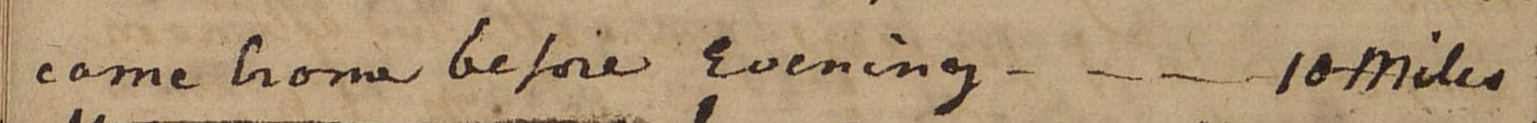come home before Evening--- 10 Miles
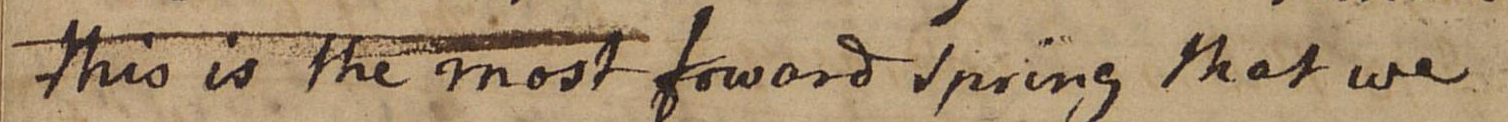this is the most foward Spring that we
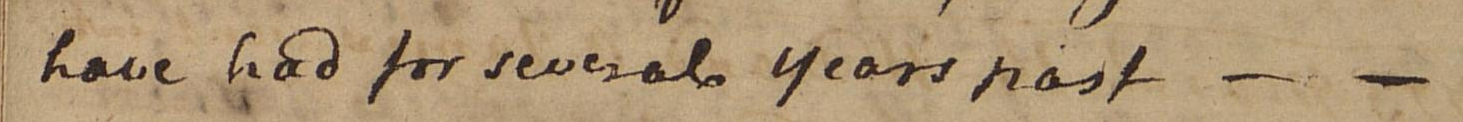have had for several years past-
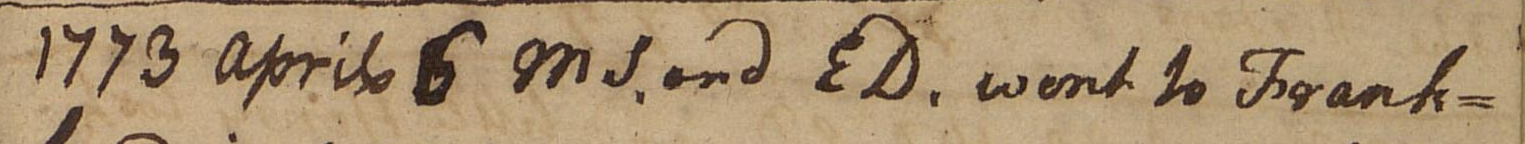1773 April & MS. and ED. went to Frank-
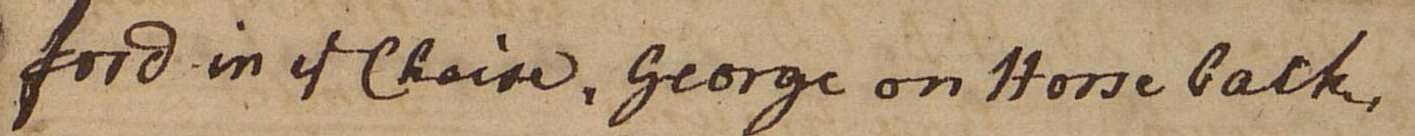ford in y^e Chaise, George on Horse back,
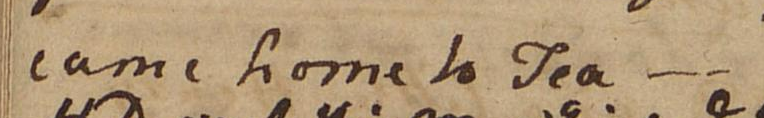came home to Tea-
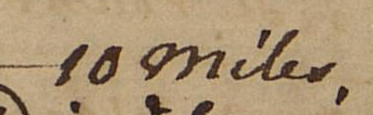10 Miles
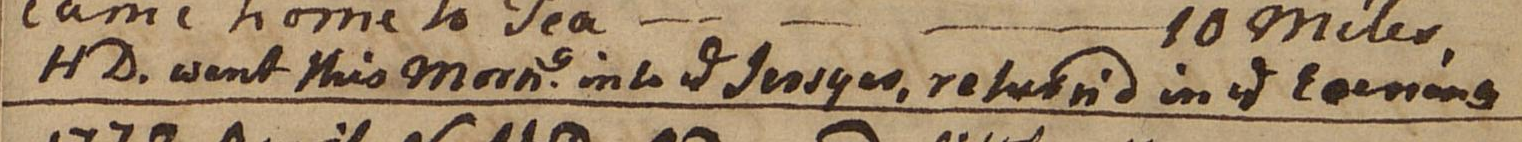HD. went this Morn^g. into y^e Jersyes, return'd in y^e Evening
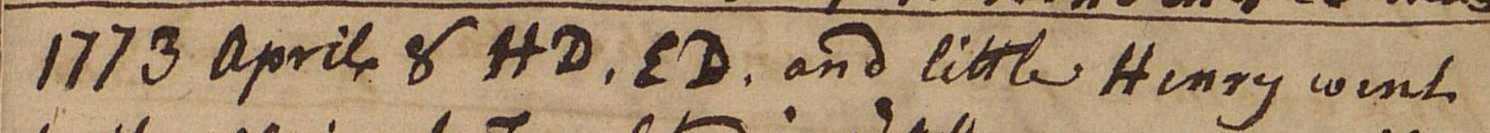1773 April 8 HD, ED. and little Henry went
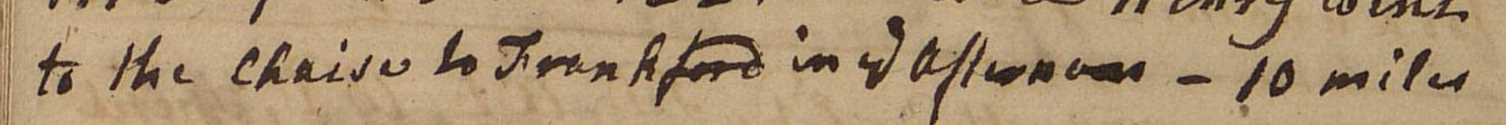to the chaise to Frankford in y^e Afternoons- 10 miles
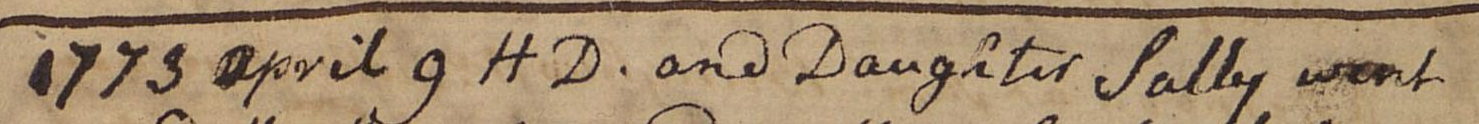1773 April 9 HD. and Daughter Sally want
